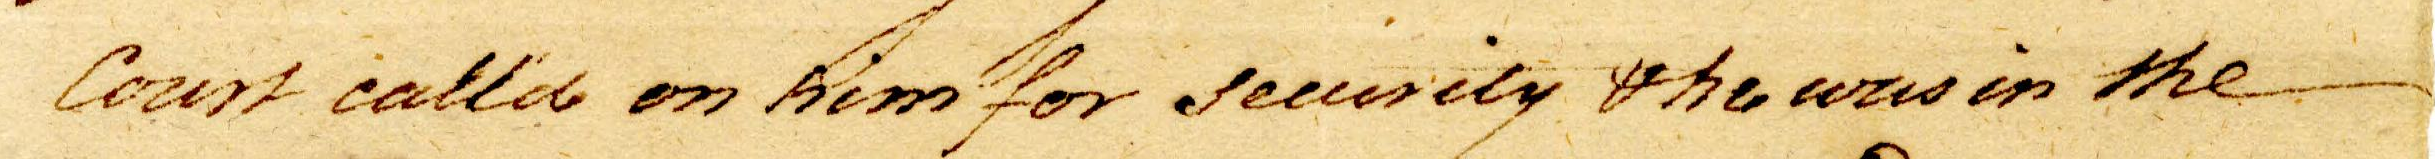Court called on him for security per he was in the
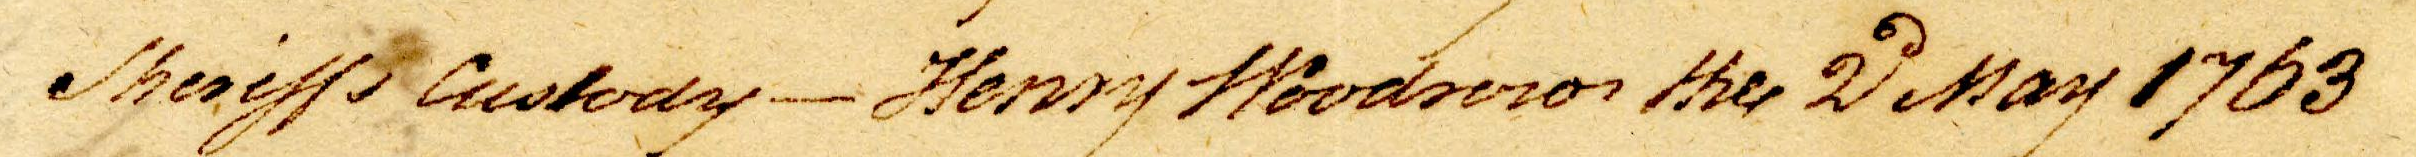Sheriffs Custody. Henry Woodrow the 2^d May 1763
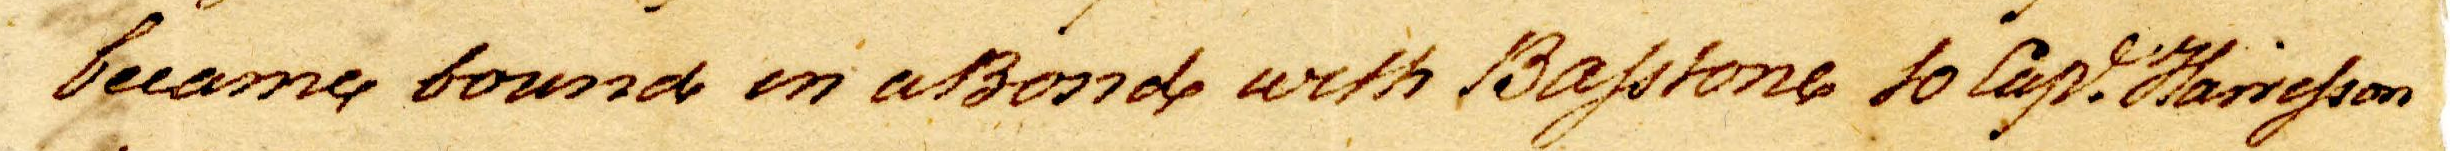became bound in a Bond with Basstone to Cap^t. Harrisson
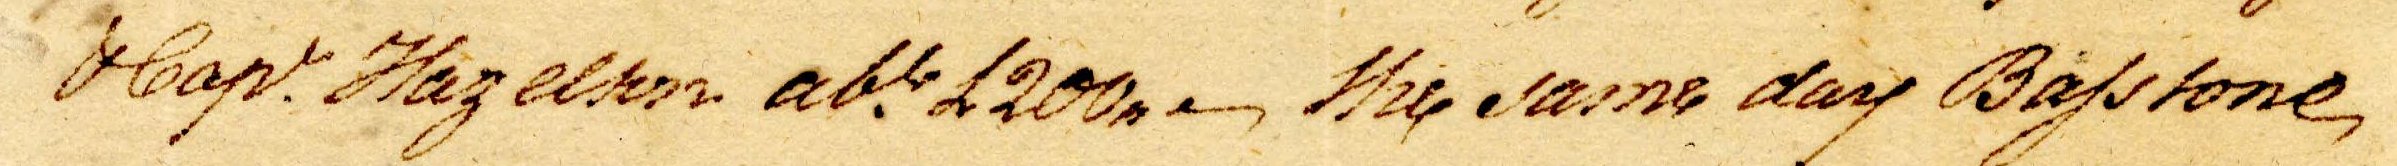& Cap^t. Hazelton ab^t. £220. the same day Basstone
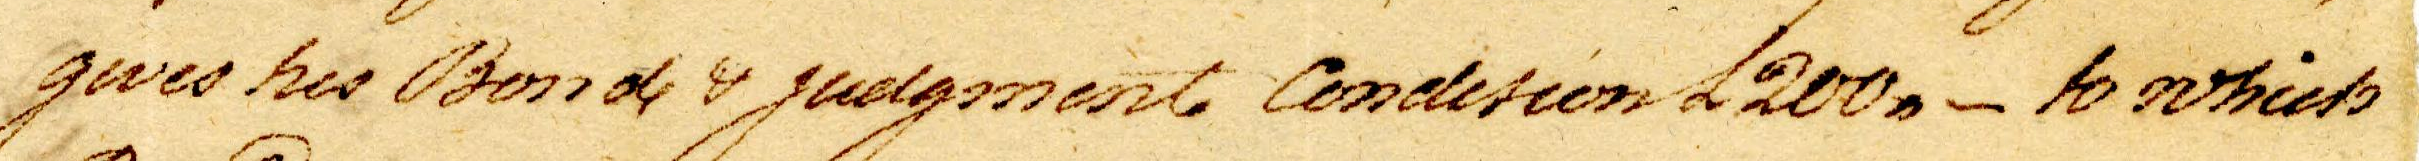gives his Bond & judgment Condition £200- to which
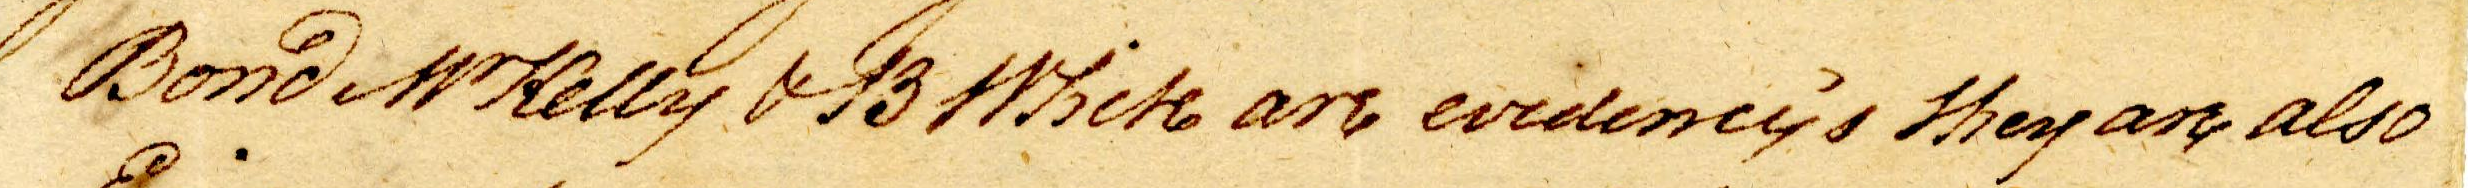Bond M^r Kelly & 13 Which are evidence's they are also
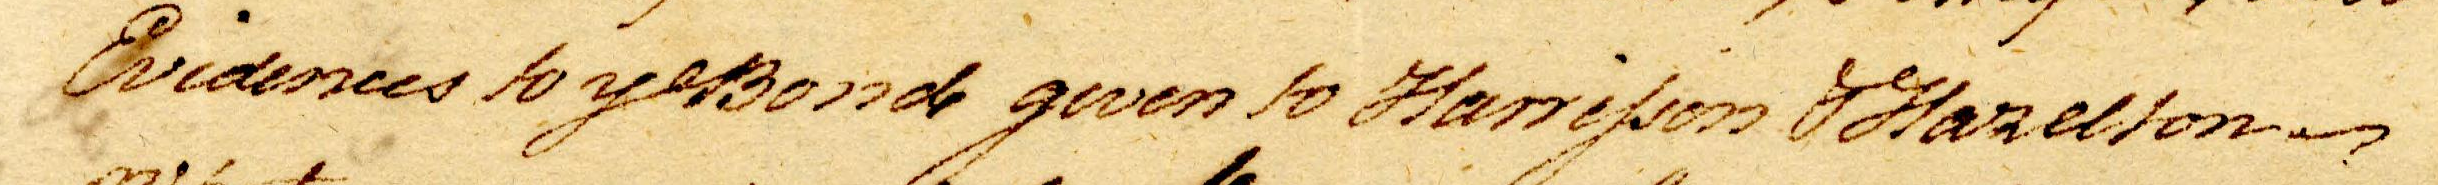Evidences to y^e Bond given to Harrisson & Hazelton
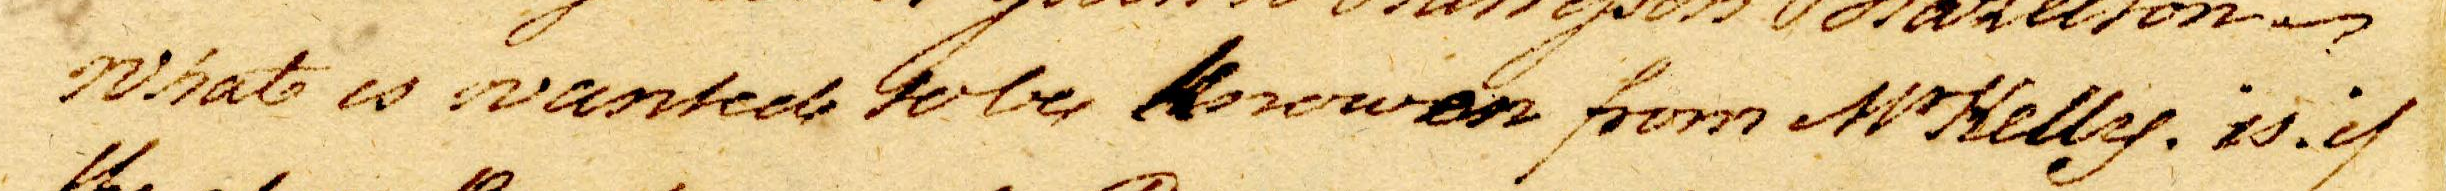What is wanted to be known from M^r Kelly, is it
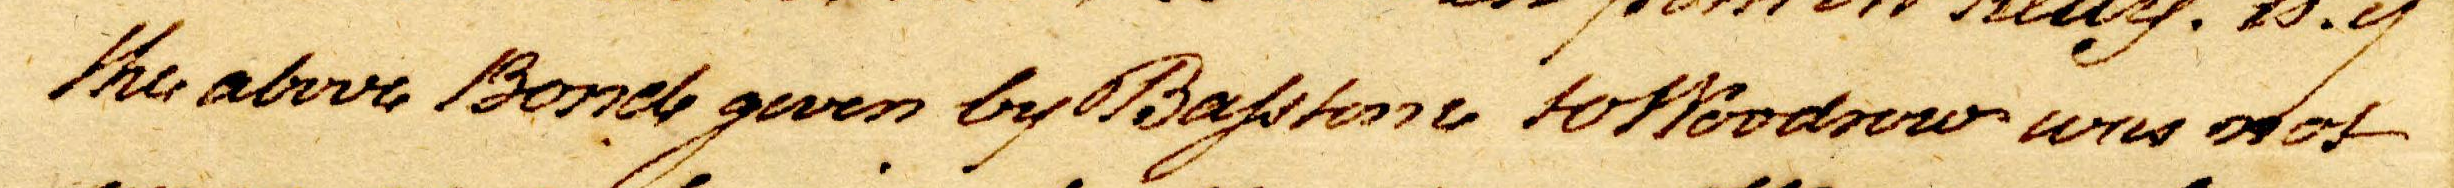the above Bond given by Basstone to Woodrow was not
